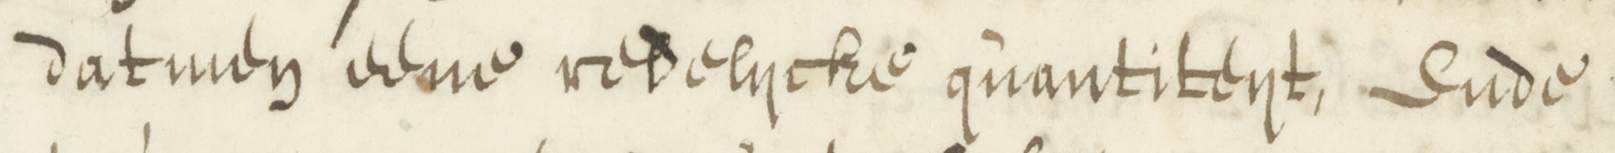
datmen eene redelycke quantiteyt, ende
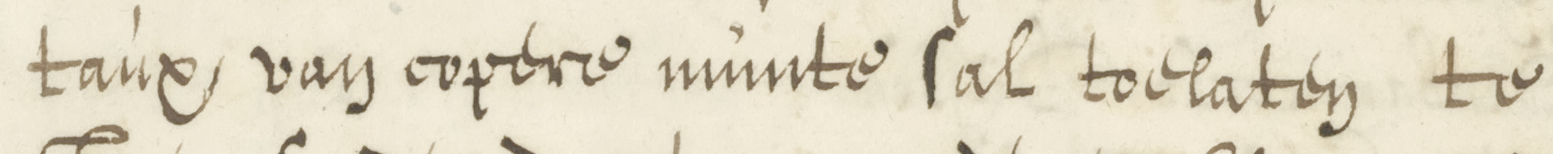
taux van copere munte sal toelaten te
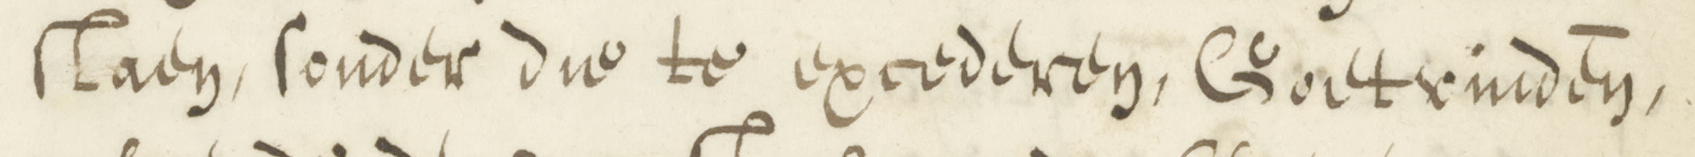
slaen, sonder die te excederen, Goetvinden,
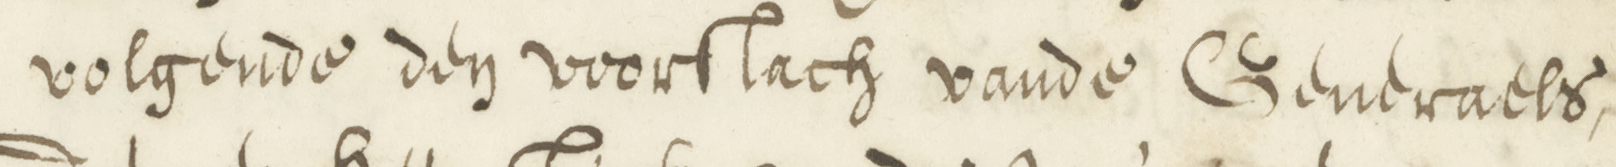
volgende den voorslach vande Generaels,
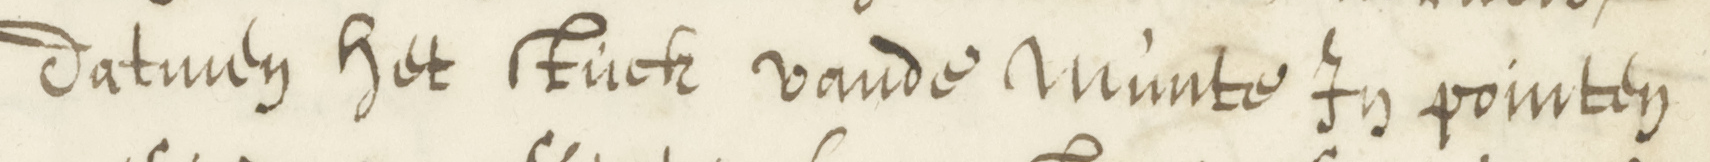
datmen het stuck vande Munte In pointen
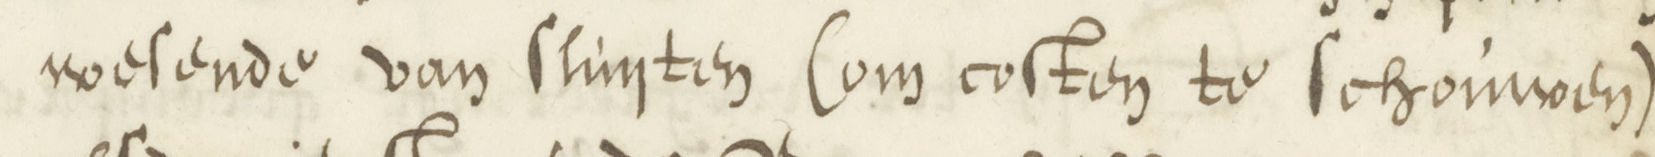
wesende van sluyten (om costen te schouwen)
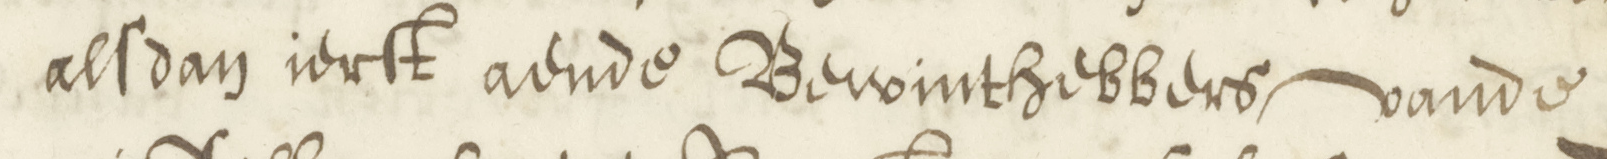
alsdan ierst aende Bewinthebbers vande
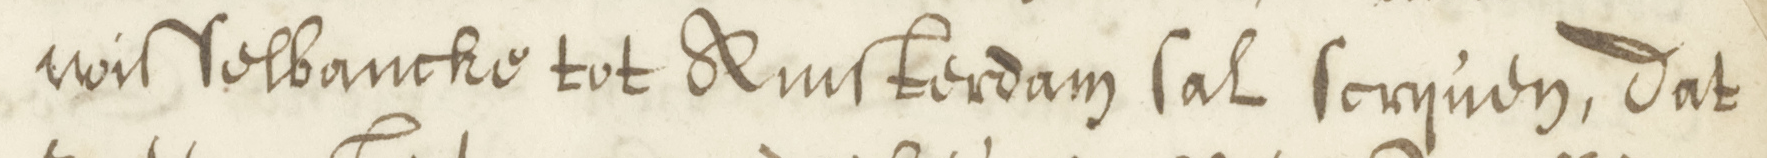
wisselbancke tot Amsterdam sal scryuen, dat
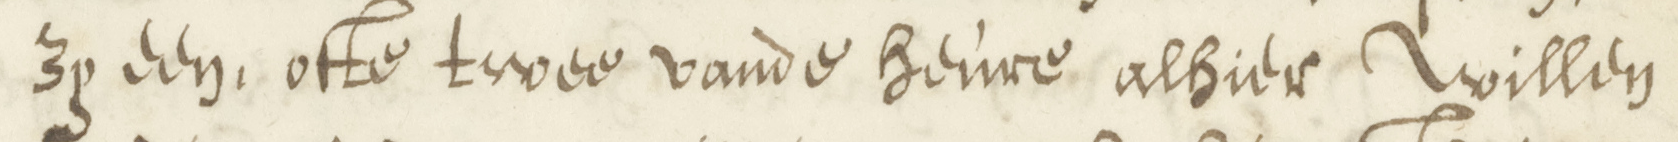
zy een, ofte twee vande heure alhier willen
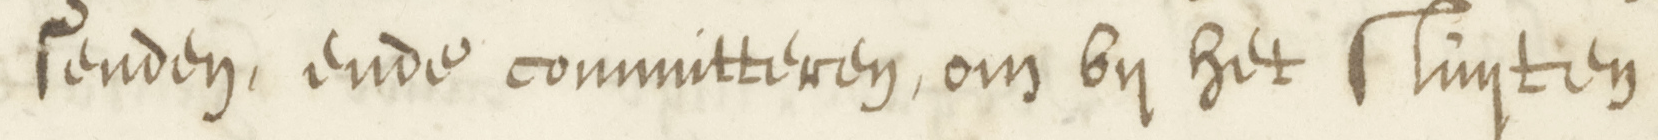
senden, ende committeren, om by het sluyten
